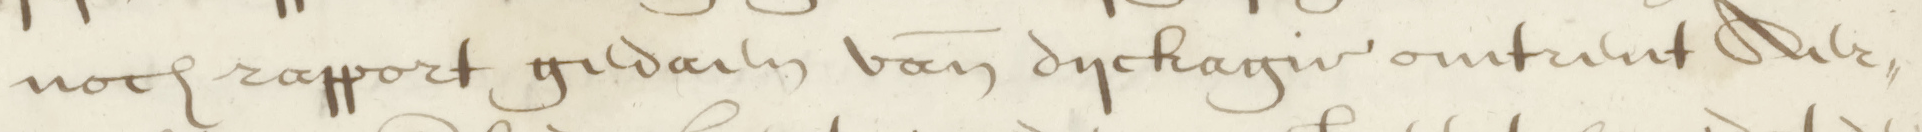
noch rapport gedaen van dyckagie omtrent Aer„
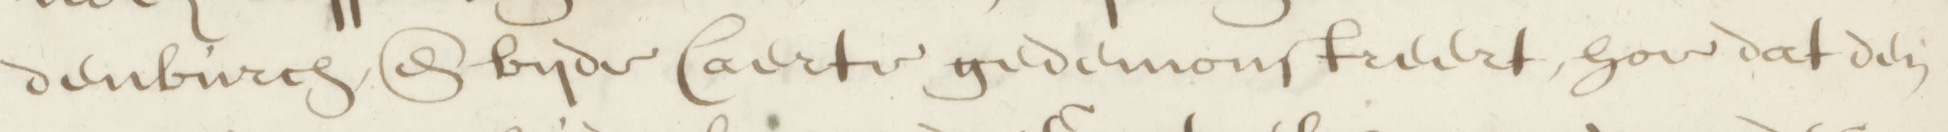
denburch, & byde Caerte gedemonstreert, hoe dat den
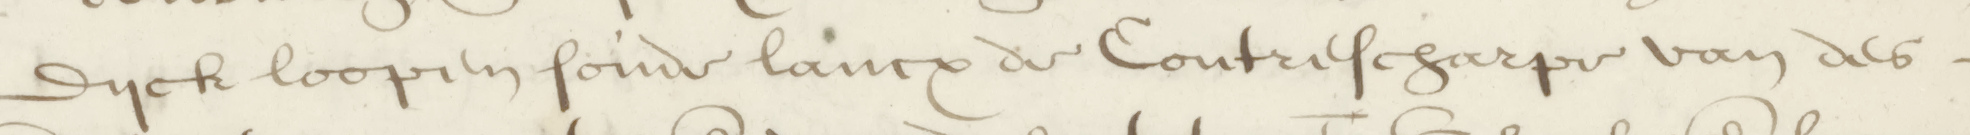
Dyck loopen soude lancx de Contrescharpe van des
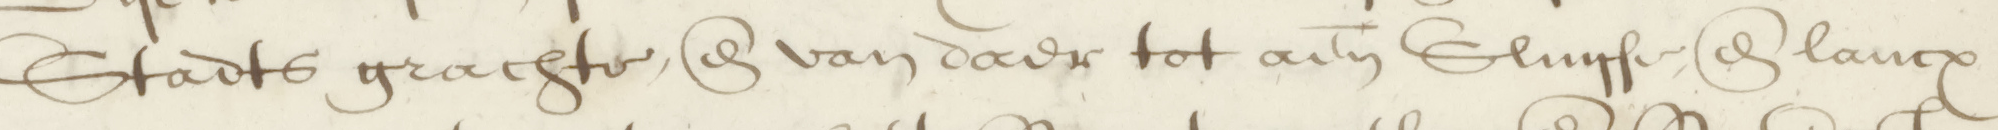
Stadts grachte, & van daer tot aen Sluyse, & lancx
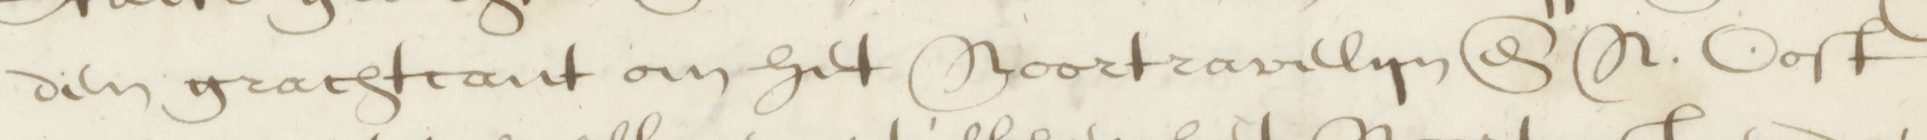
den grachtcant om het Noortravelyn & N. Oost
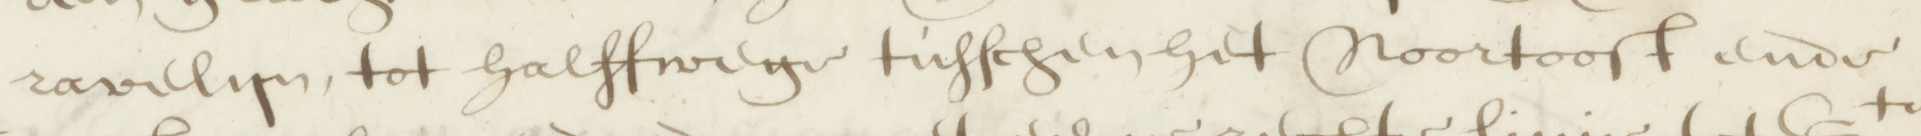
ravelyn, tot halffwege tusschen het Noortoost ende
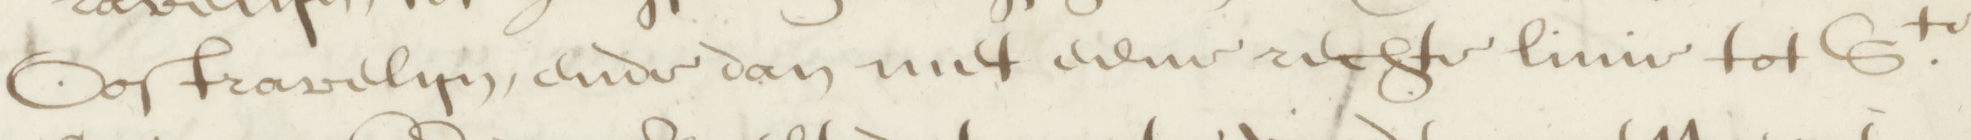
Oostravelyn, ende dan met eene rechte linie tot St.
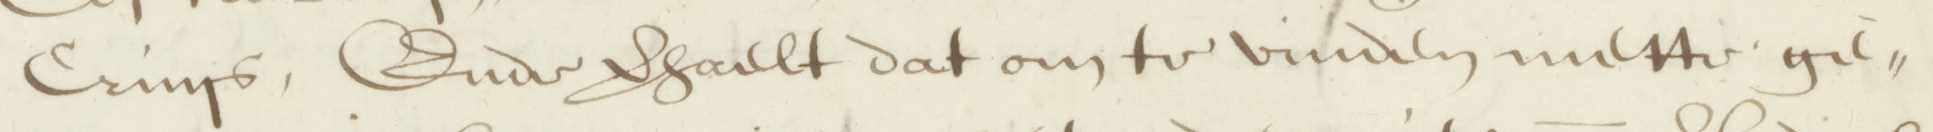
Cruys. Ende vhaelt dat om te vinden mette ge„
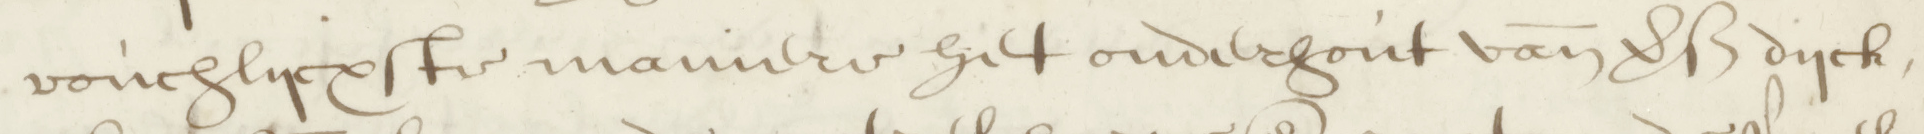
vouchlycxste maniere het onderhout van vs dyck,
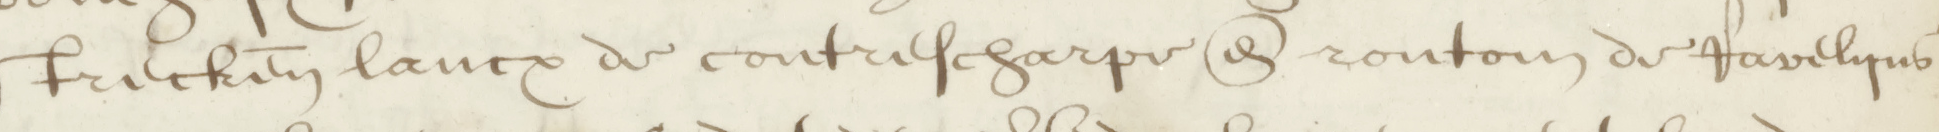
strecken lancx de contrescharpe & rontom de Ravelyns
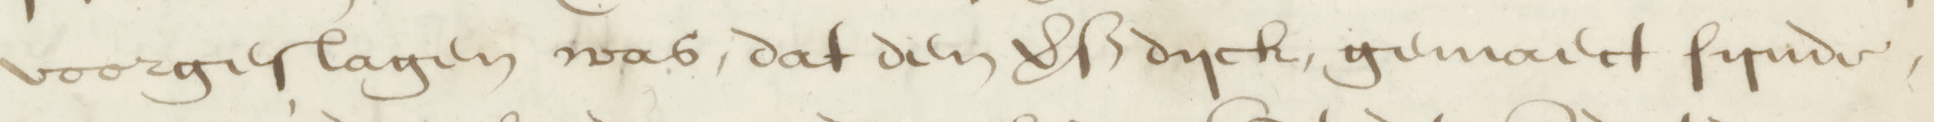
voorgeslagen was, dat den vs dyck, gemaect synde,
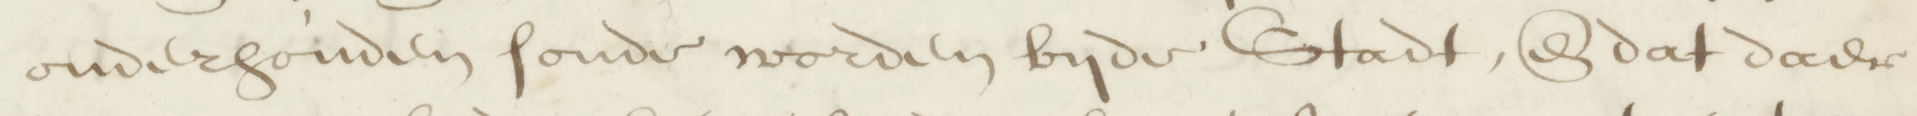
onderhouden soude worden byde Stadt, & dat daer
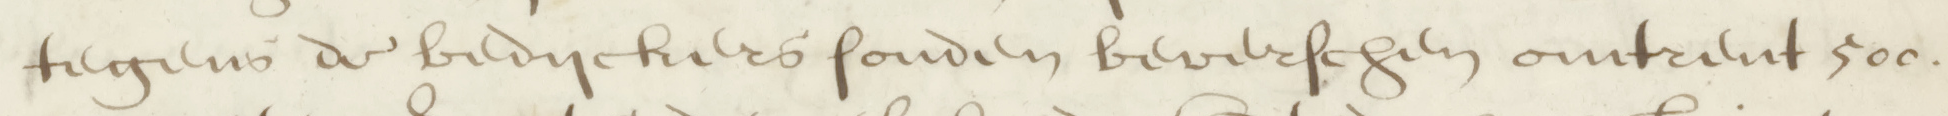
tegens de bedijckers souden beverschen omtrent 500
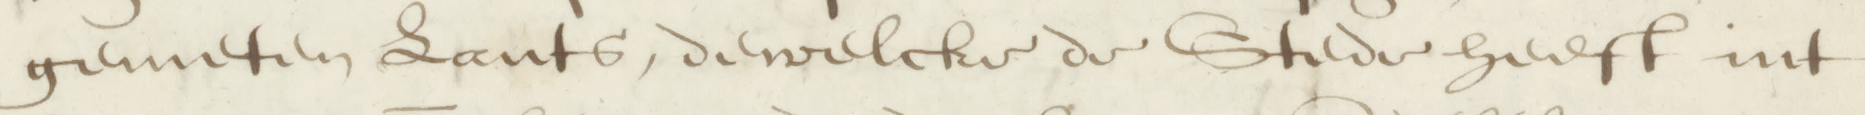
gemeten Lants, dewelcke de Stede heeft int
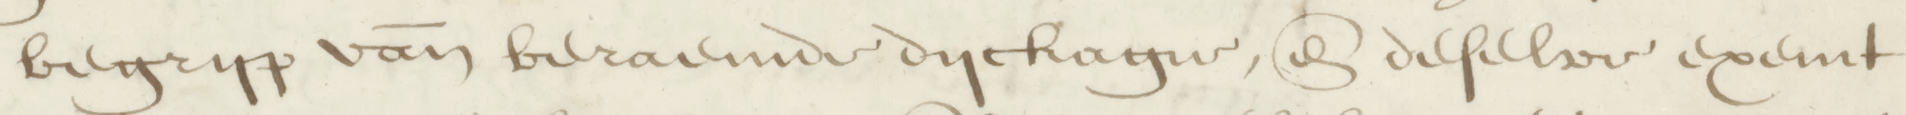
begryp van beraemde dyckagie, & deselve exemt
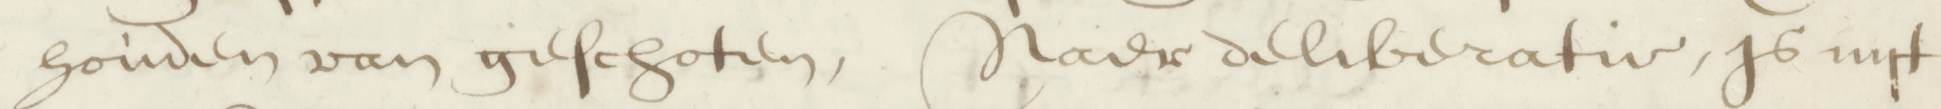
houden van geschoten. Naer deliberatie, is uyt
